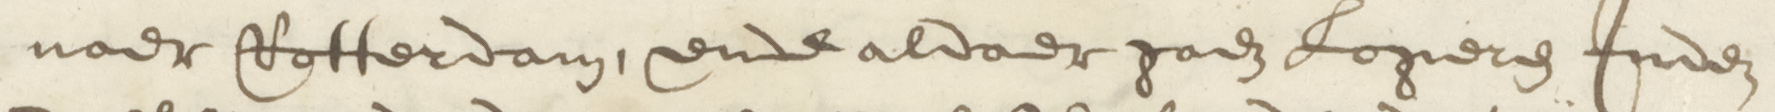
naer Rotterdam, ende aldaer gaen logieren Inden
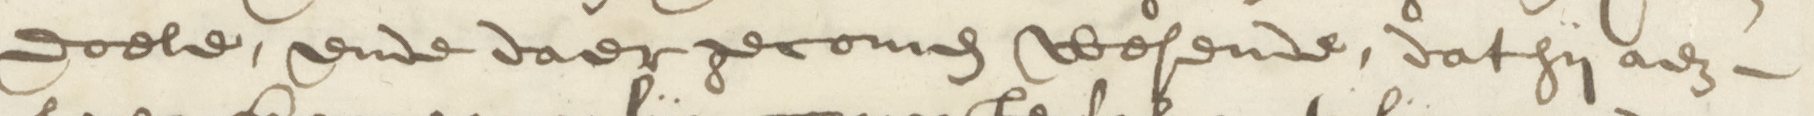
Doele, ende daer gecomen wesende, dat hij aen —
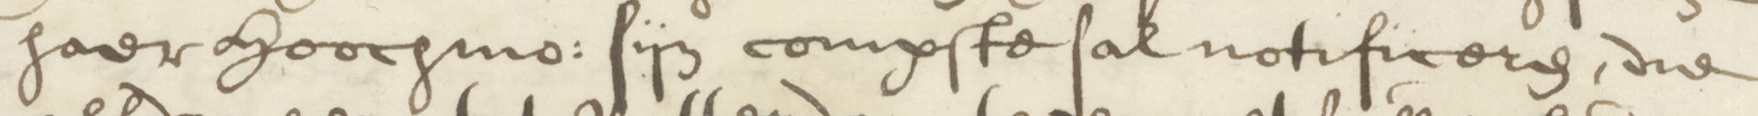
haer Hoochmo: sijn compste sal notificeren, die
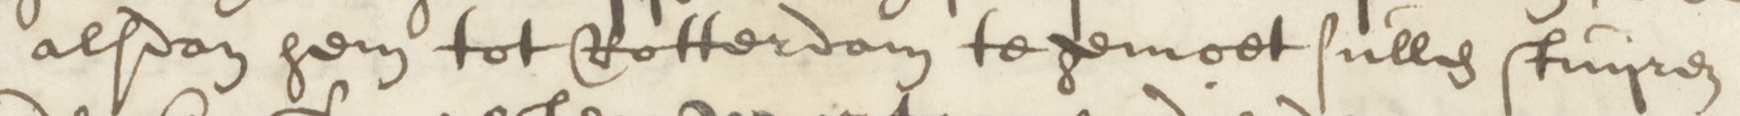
alsdan hem tot Rotterdam te gemoet sullen stuijren
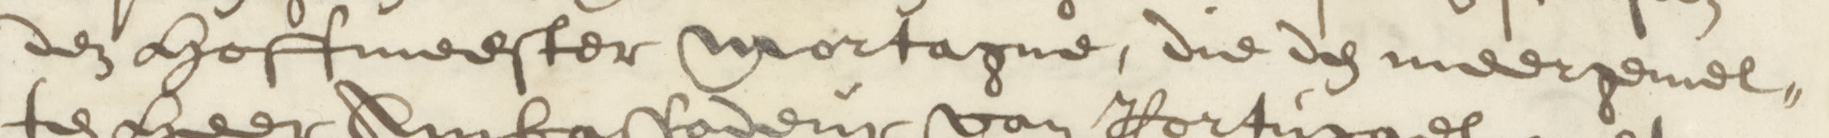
den Hoffmeester Mortagne, die den meergemel„
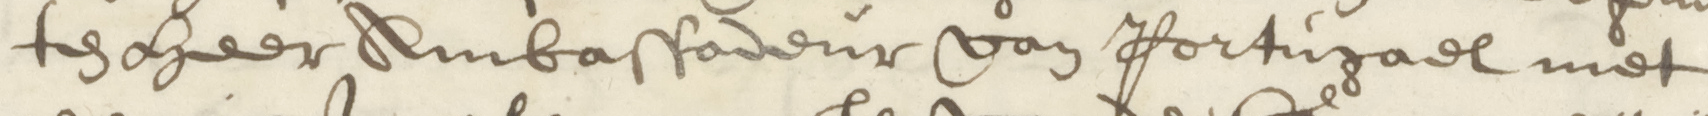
te heer Ambassadeur van Portugael met
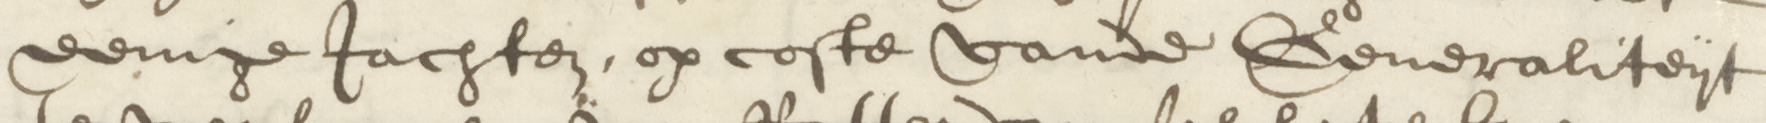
eenige Jachten, op coste vande Generaliteijt
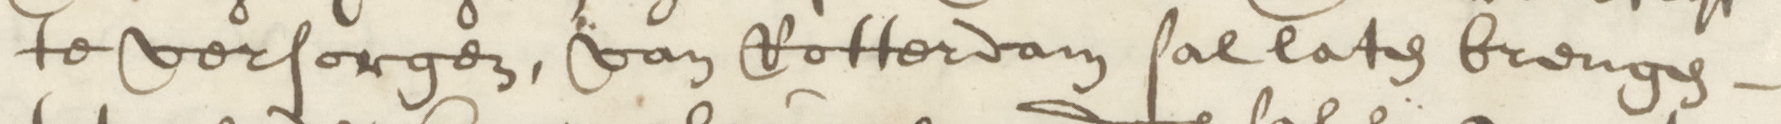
te versorgen, van Rotterdam sal laten brengen -
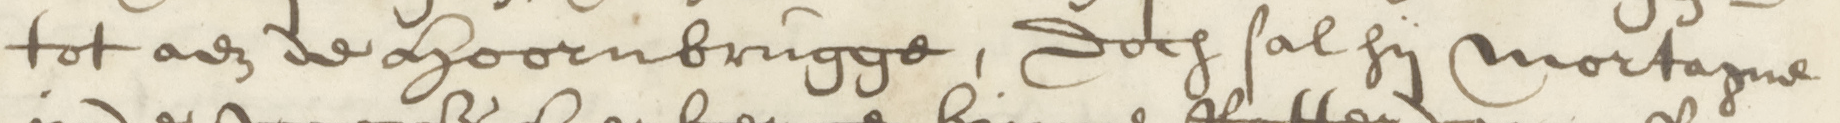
tot aen de Hoornbrugge. Doch sal hij Mortagne
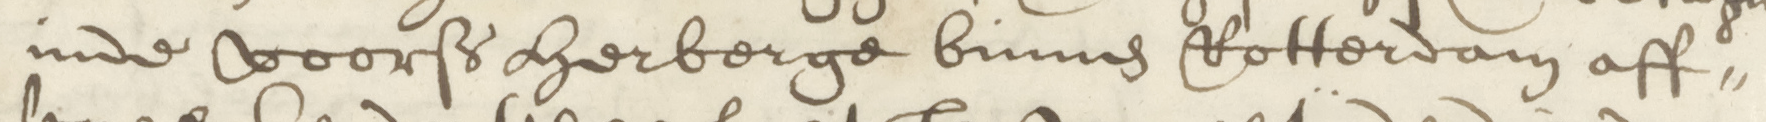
inde voorsz herberge binnen Rotterdam aff„
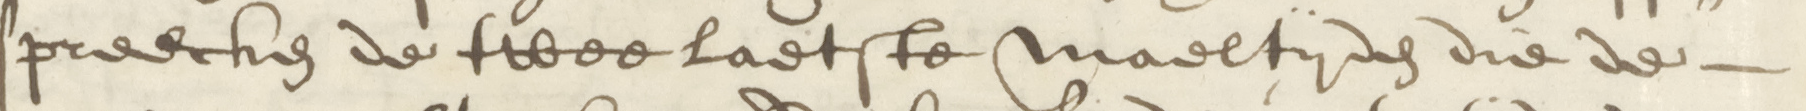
spreecken de twee laetste maeltijden die de —
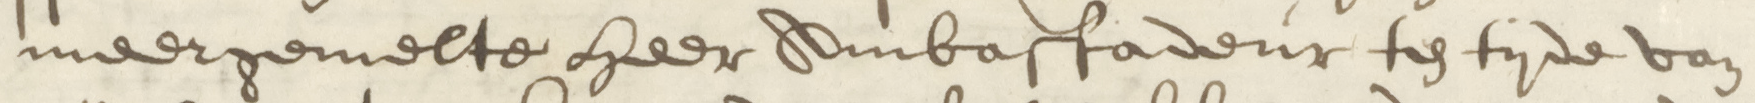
meergemelte heer Ambassadeur ten tijde van
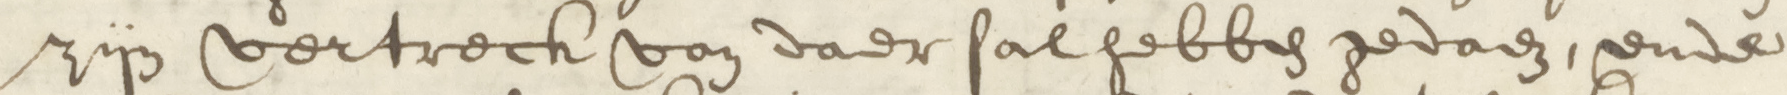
zijn vertreck van daer sal hebben gedaen, ende
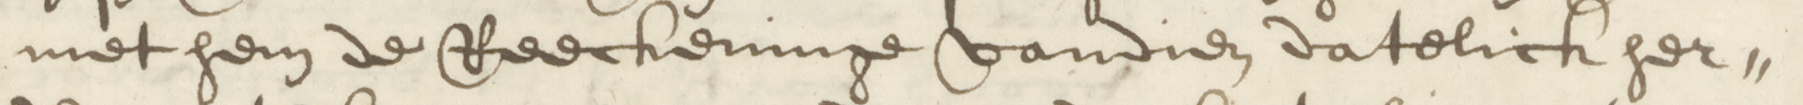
met hem de Reeckeninge vandien datelick her„
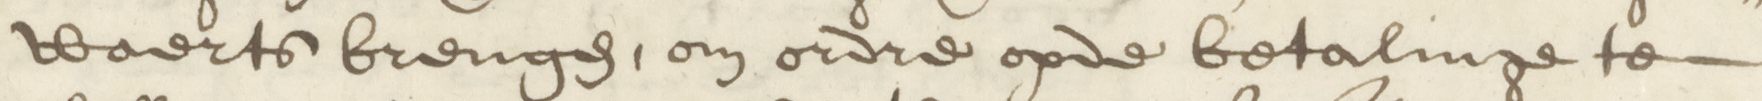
waerts brengen, om ordre opde betalinge te
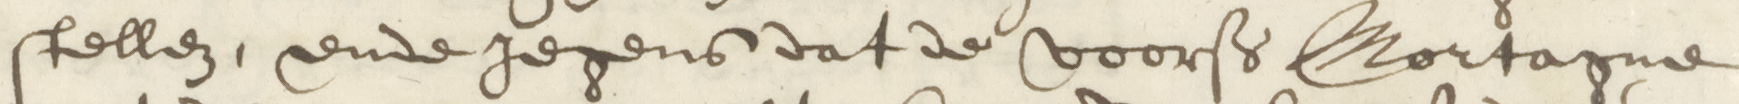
stellen, ende Jegens dat de voorsz Mortagne
